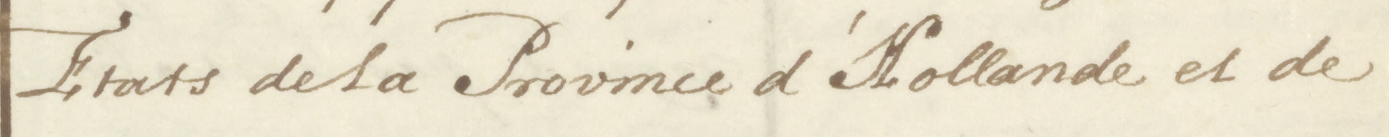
Etats de la Province d'Hollande et de
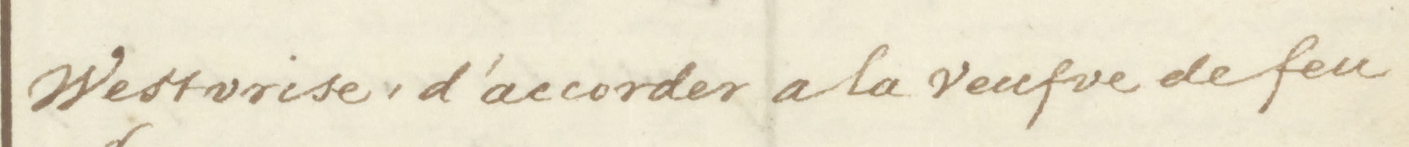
Westvrise, d'accorder a la veufve de feu
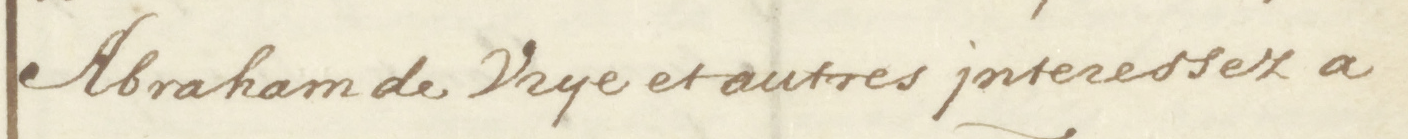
Abraham de Vrye et autres interessez a
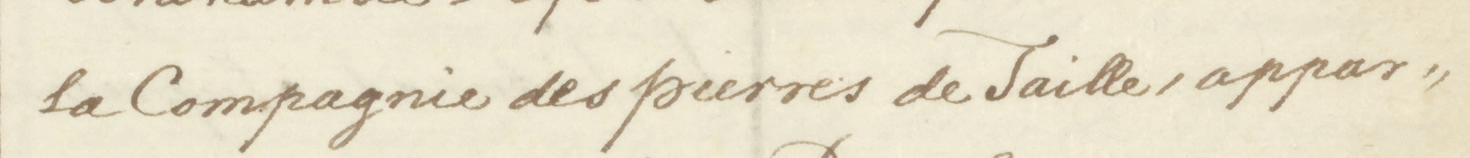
la Compagnie des pierres de Taille, appar„
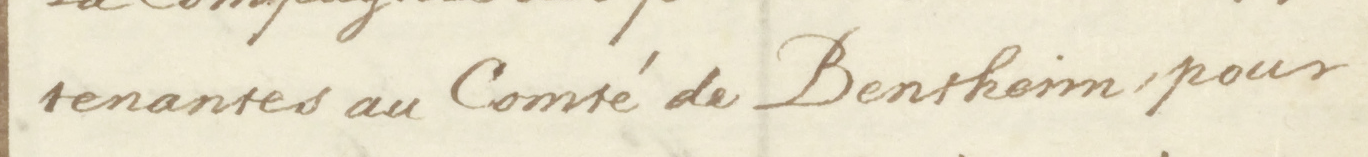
tenantes au Comté de Bentheim, pour
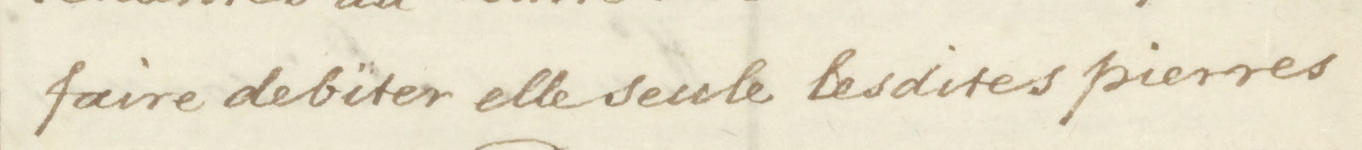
faire debiter elle seule lesdites pierres
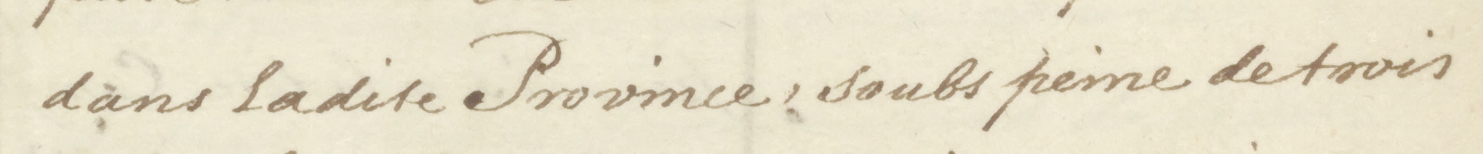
dans Ladite Province, soubs peine de trois
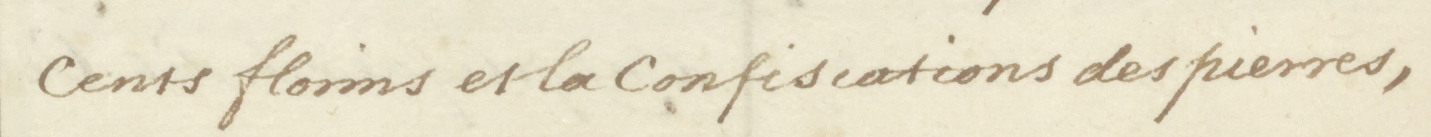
cents florins et la confiscations des pierres,
